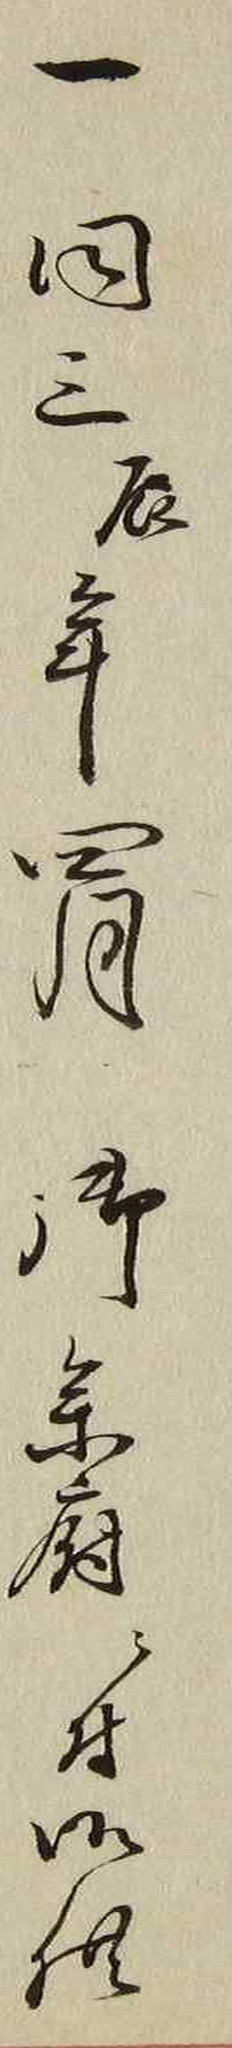一同三辰年四月御参府に付御供
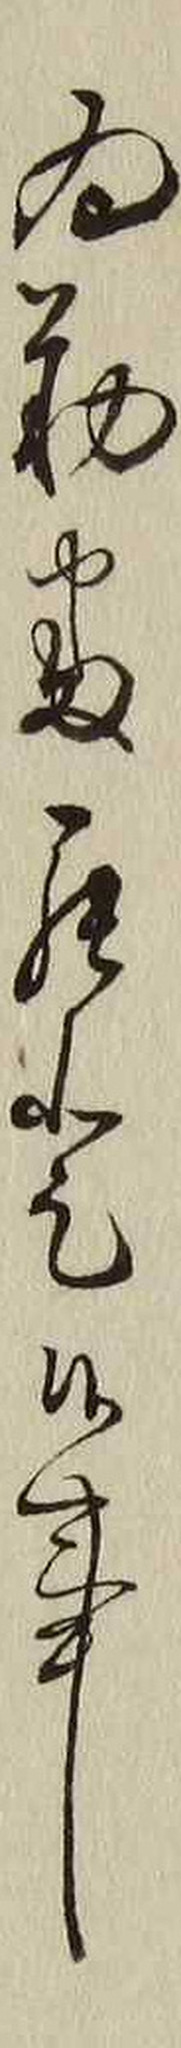為勤番罷登候事
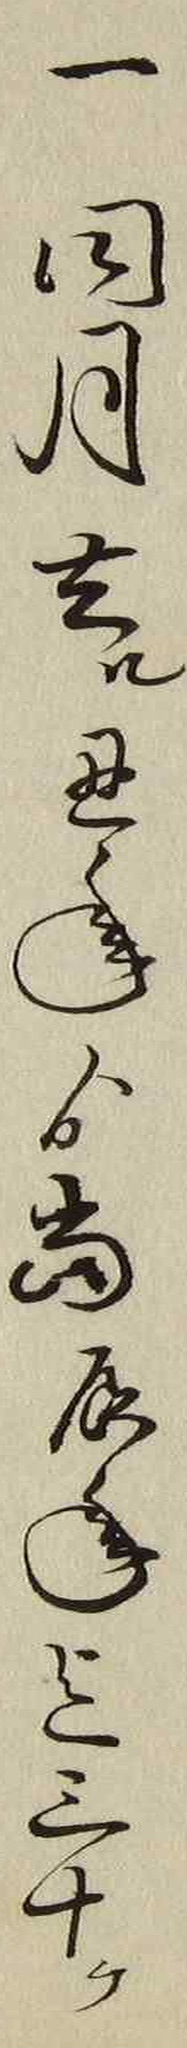一同月去る丑年ゟ当辰年迄三十ケ
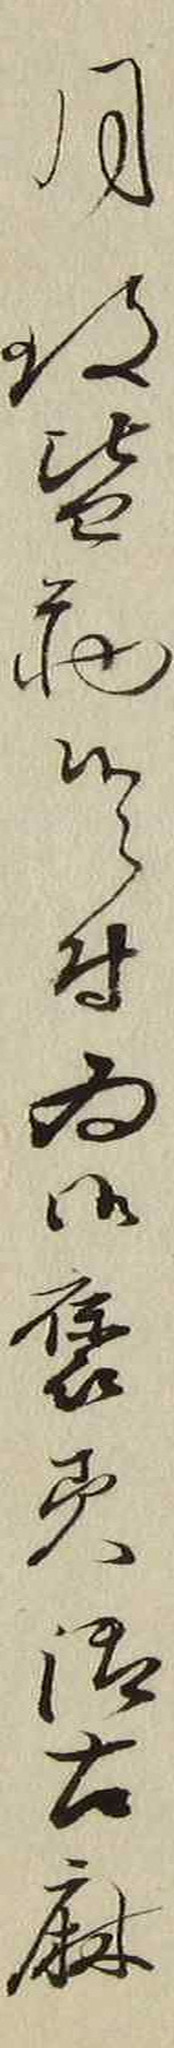月致皆勤候に付為御褒美御古麻
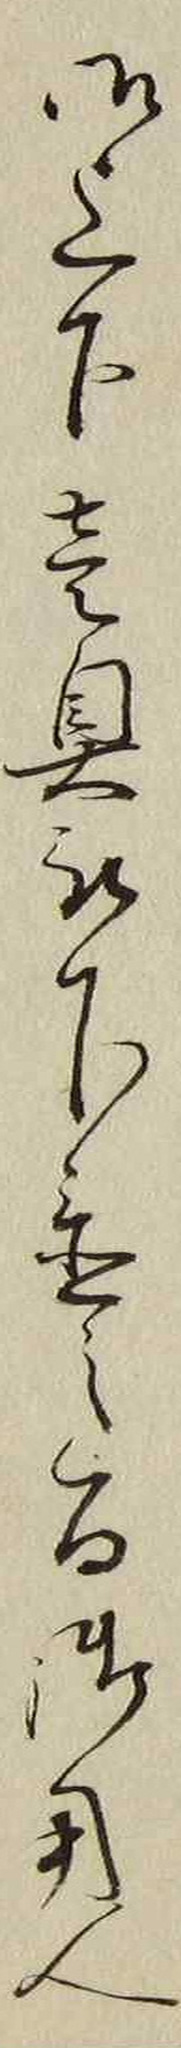御上下一具被下置の旨御用人
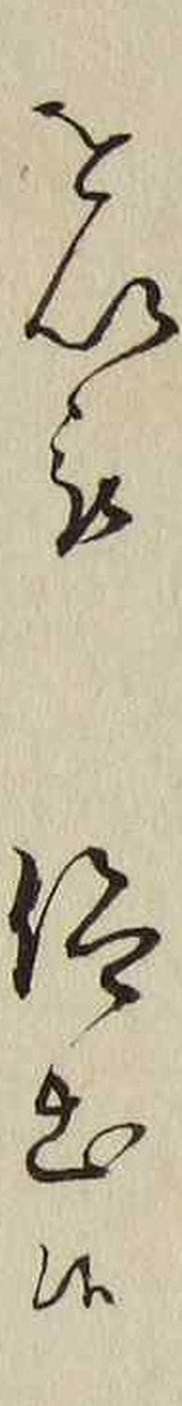を以被仰出候事
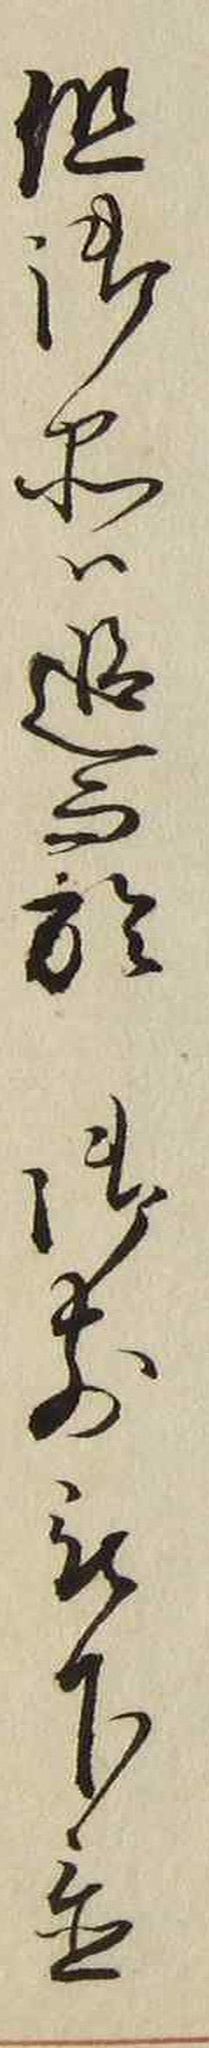但御品は追而於御前被下置

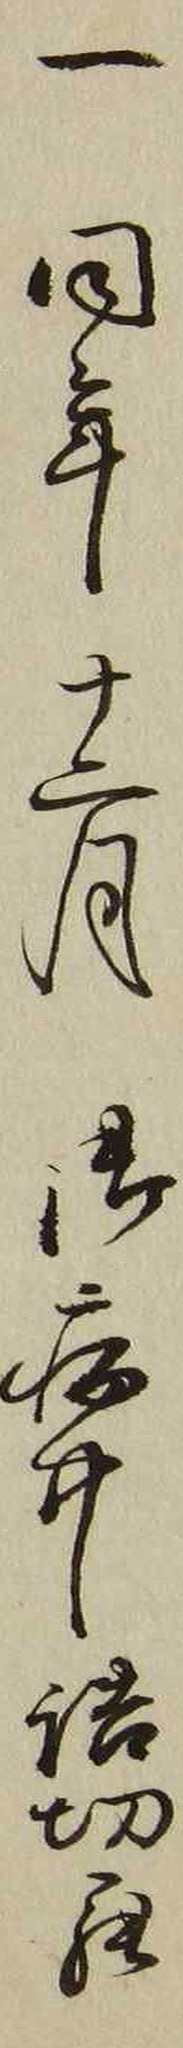一同年十二月御病中詰切罷
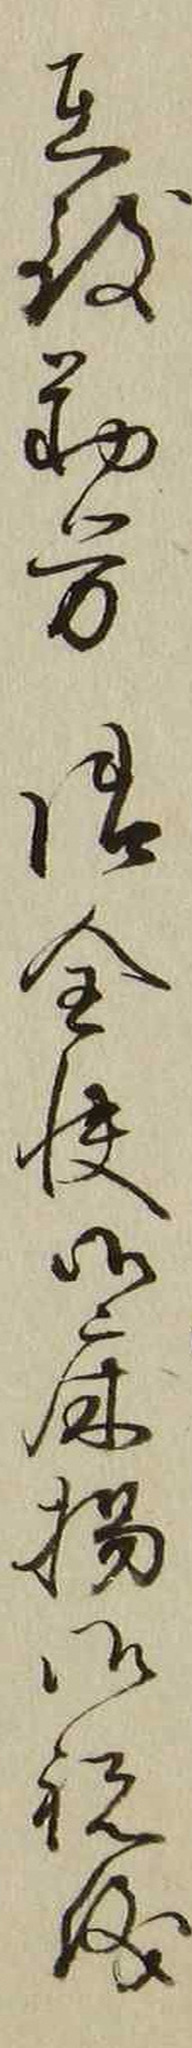在致勤労御全快御床揚御祝儀
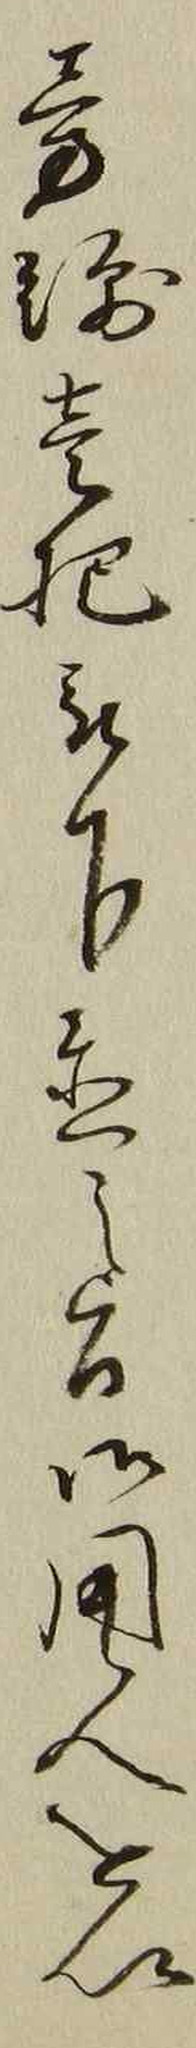旁綿壱把被下置の旨御用人を以
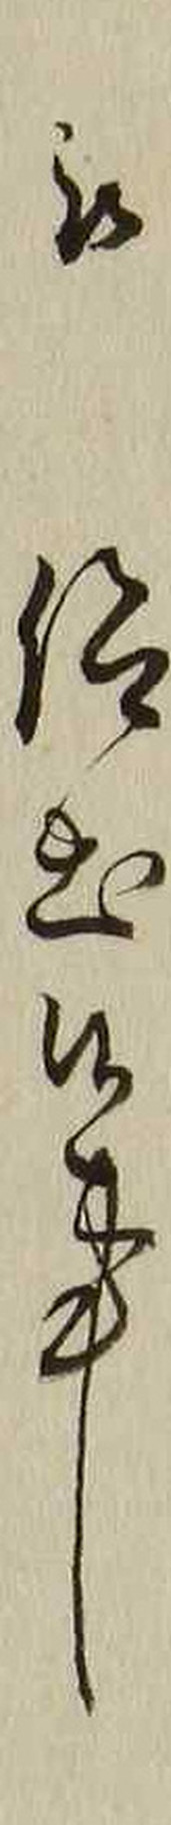被仰出候事
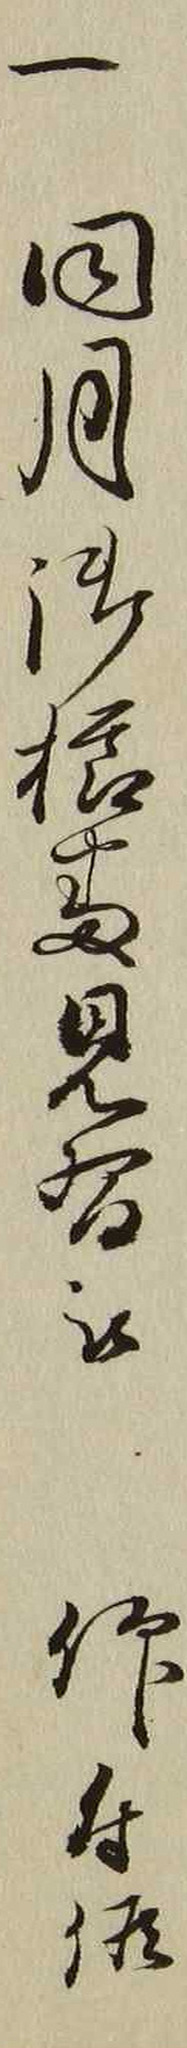一同月御様番見習被仰付候
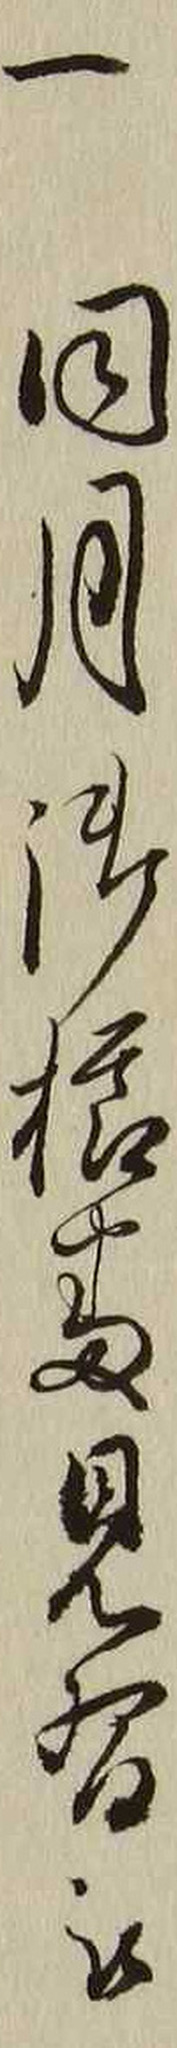一同月御様番見習被仰付候
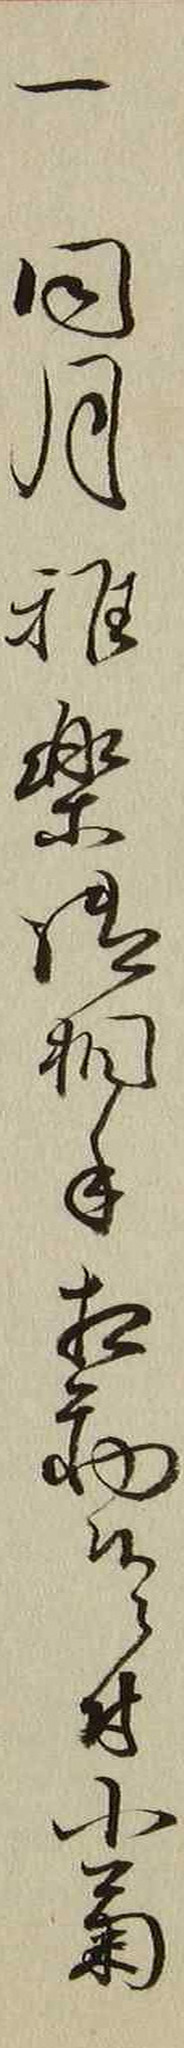一同月雅楽御相手相勤候に付小菊
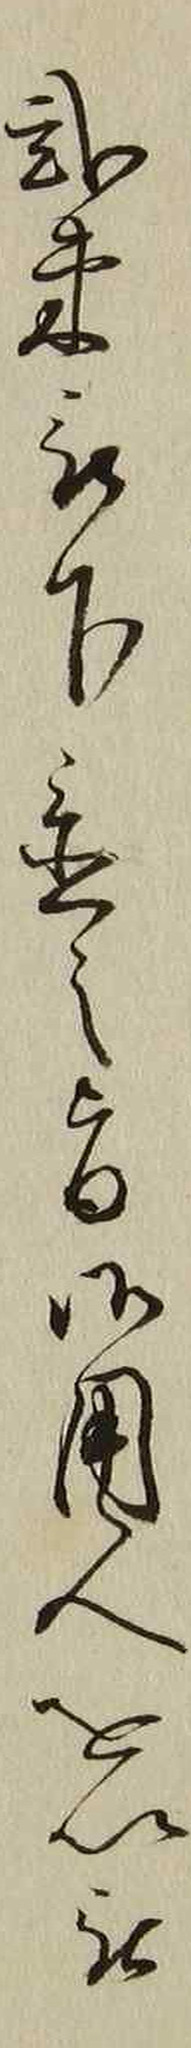弐束被下置の旨御用人を以被
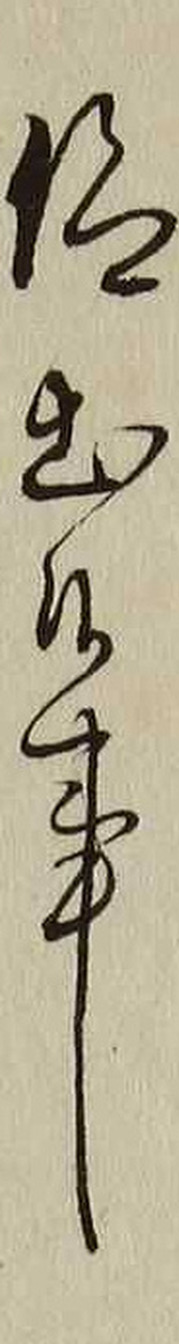仰出候事
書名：諸士系譜　巻之1　い之部1
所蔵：会津若松市立会津図書館
